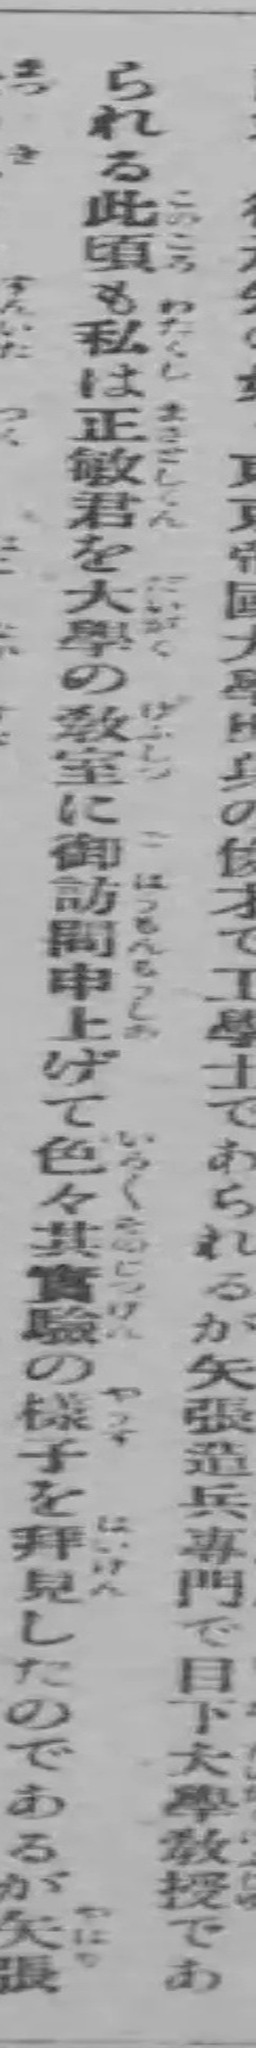られる此頃も私は正敏君を大学の教室に御訪問申上げて色々其実験の様子を拝見したのであるが矢張
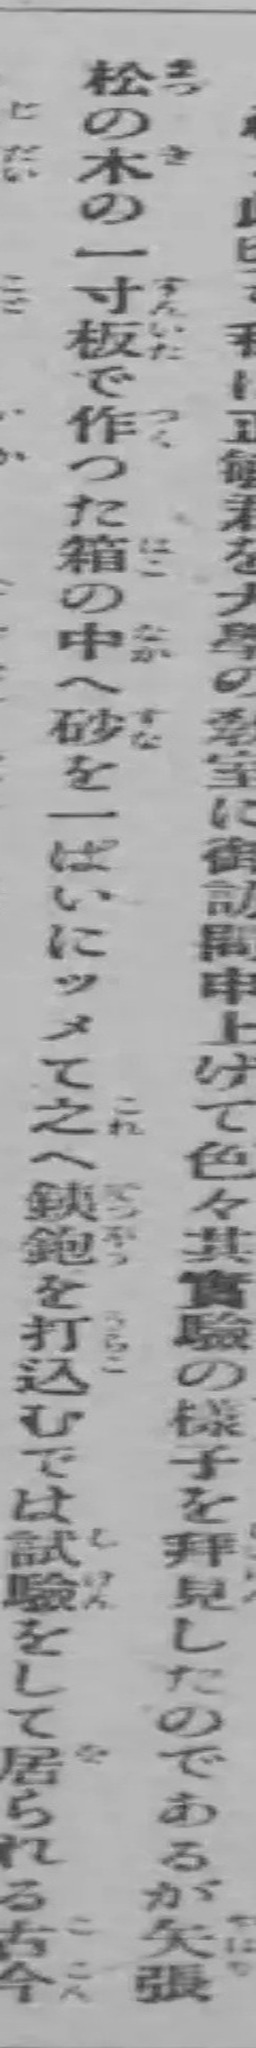松の木の一寸板で作つた箱の中へ砂を一ぱいにツメて之へ鉄砲を打込むでは試験をして居られる古今
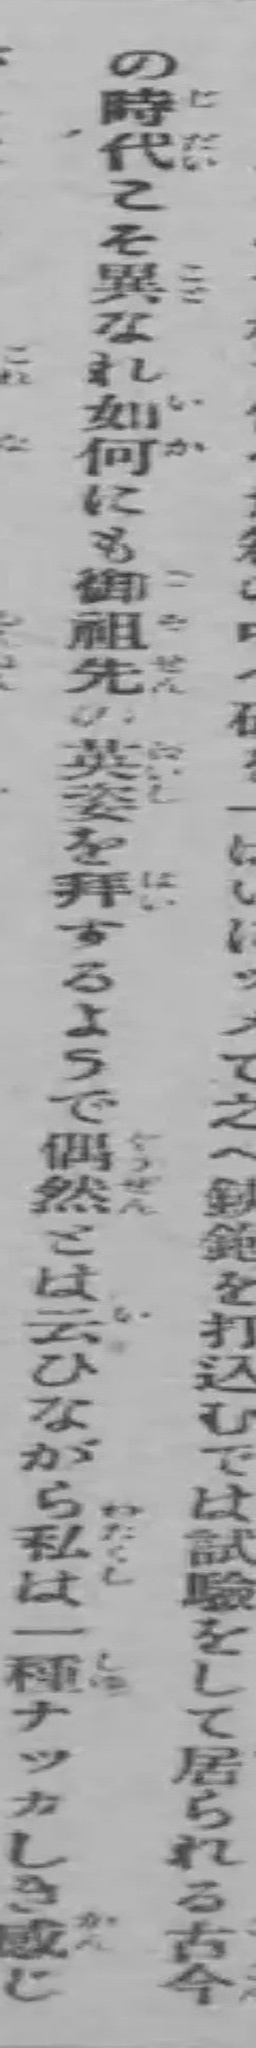の時代こそ異なれ如何にも御祖先の英姿を拝するようで偶然とは云ひながら私は一種ナツカしき感じ
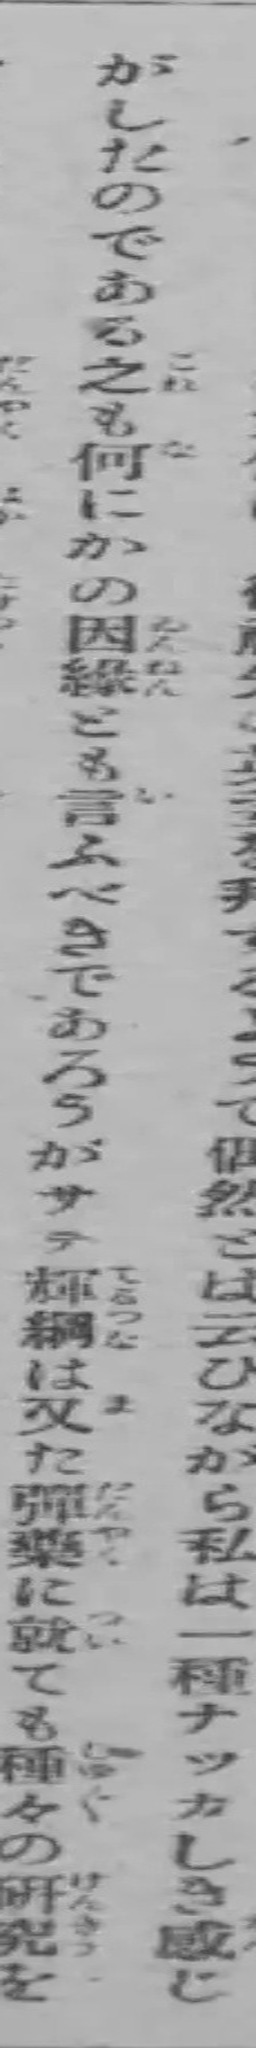がしたのである之も何にかの因縁とも言ふべきであろうがサテ輝政は又た弾薬に就ても種々の研究を
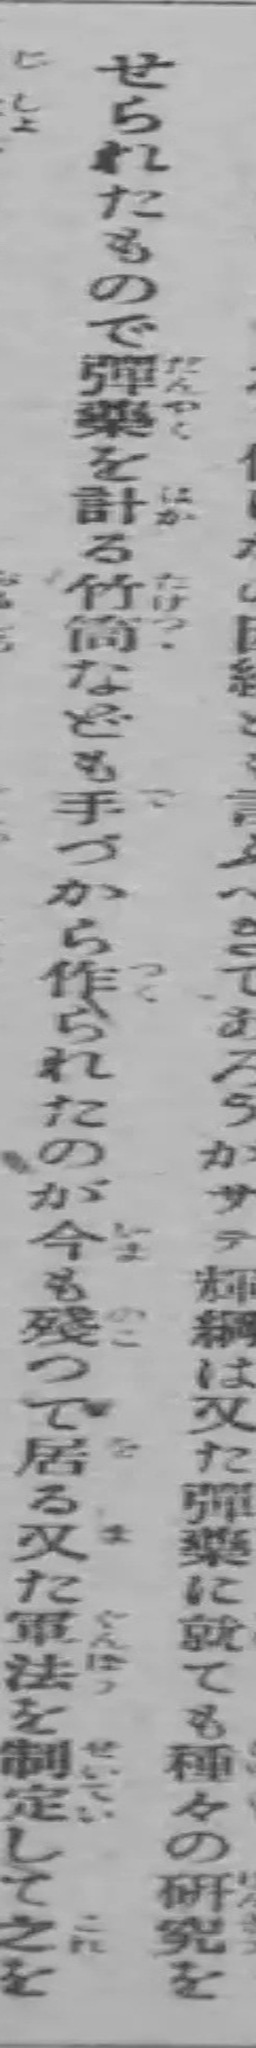せられたもので弾薬を計る竹筒なども手づから作られたのが今も残つて居る又た軍法を制定して之を
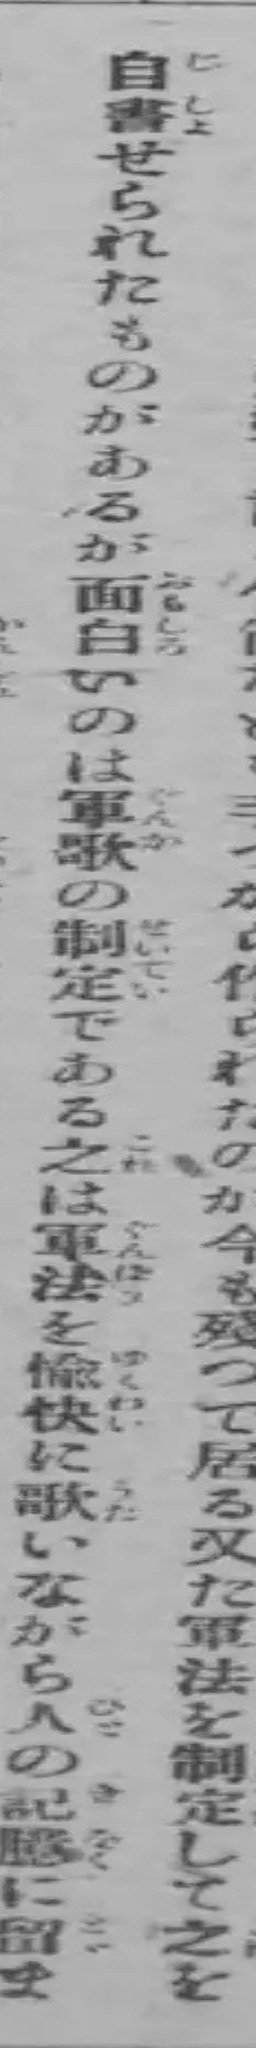自書せられたものがあるが面白いのは軍歌の制定である之は軍法を愉快に歌いながら人の記臆に留ま
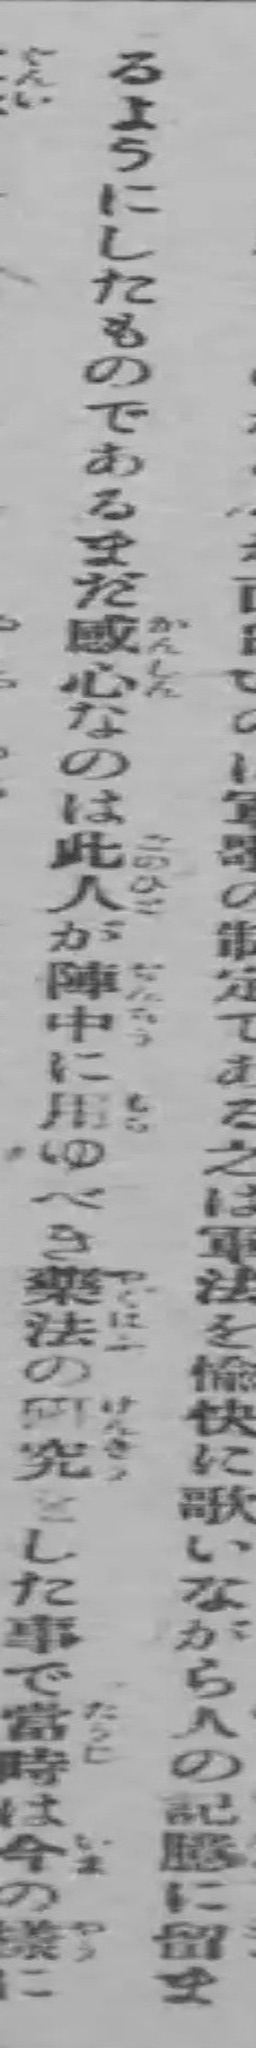るようにしたものであるまだ感心なのは此人が陣中に用ゆべき薬法の研究をした事で当時は今の様に
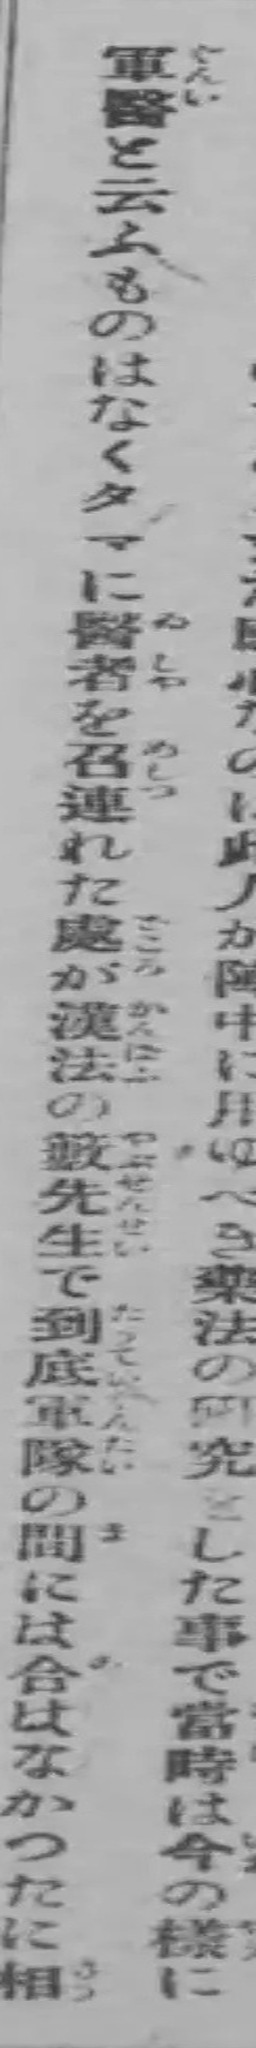軍医と云ふものはなくタマに医者を召連れた処が漢法の藪先生で到底軍隊の間には合はなかつたに相
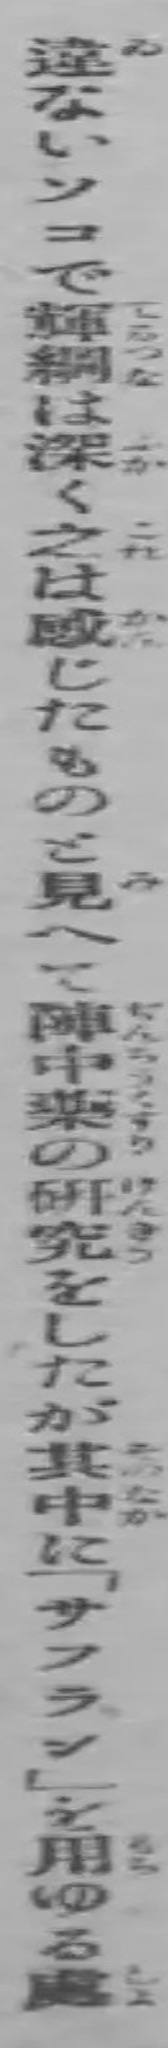違ないソコで輝綱は深く之は感じたものと見へて陣中薬の研究をしたが其中に「サフラン」を用ゆる処
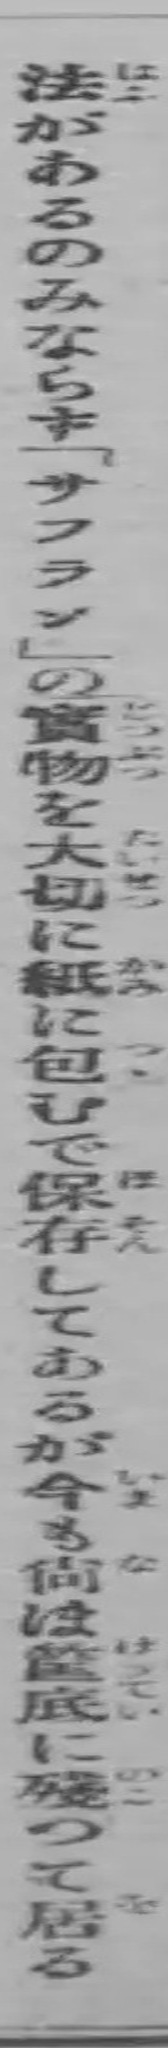法があるのみならず「サフラン」の実物を大切に紙に包むで保存してあるが今も尚ほ筺底に残つて居る
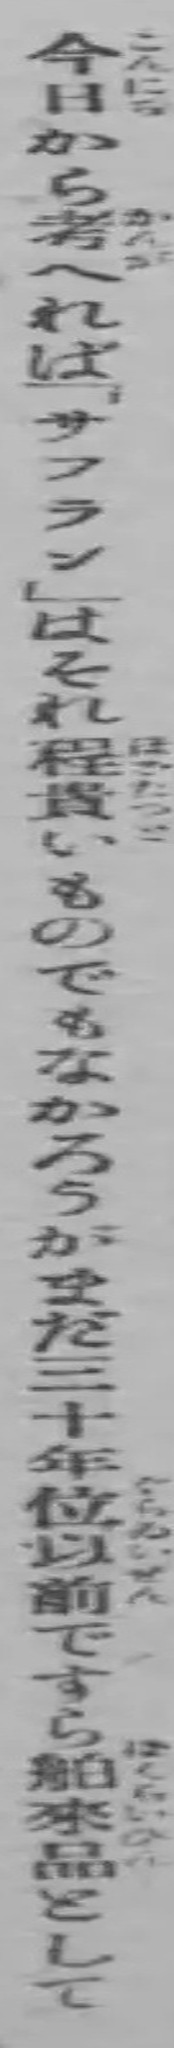今日から考へれば「サフラン」はそれ程貴いものでもなかろうがまだ三十年位以前ですら舶来品として
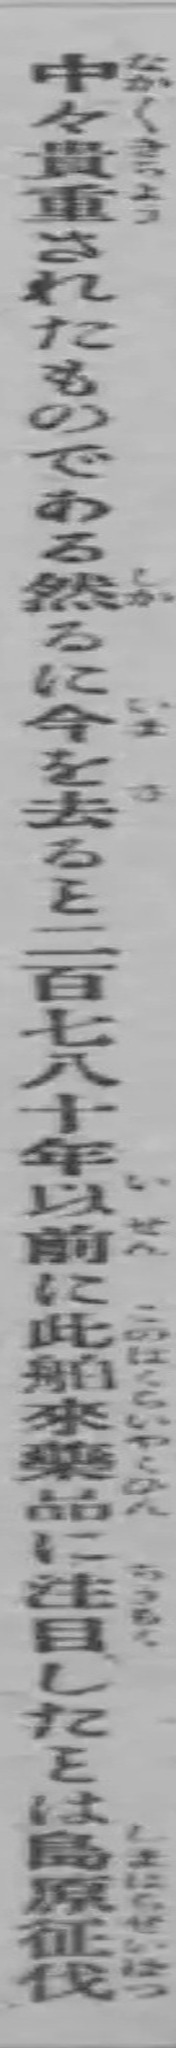中々貴重されたものである然るに今を去ること二百七八十年以前に此舶来薬品に注目したことは島原征伐
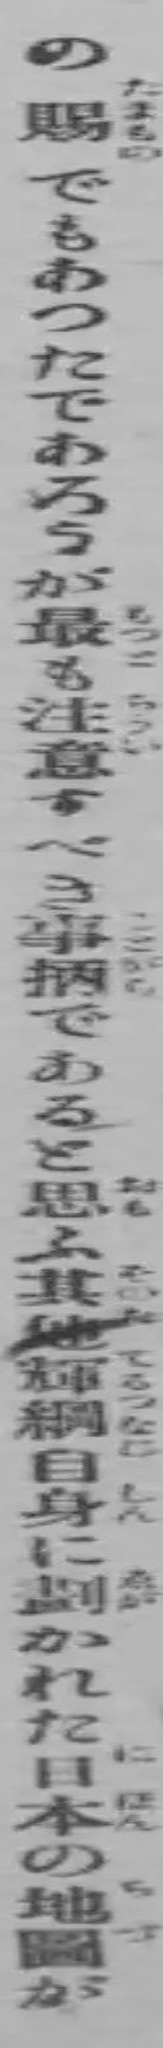の賜でもあつたであろうが最も注意すべき事柄であると思ふ其他輝綱自身に劃かれた日本の地図が
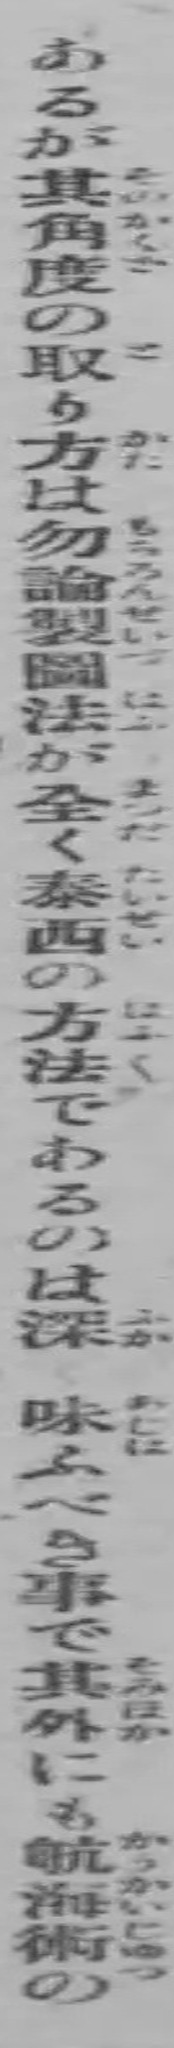あるが其角度の取り方は勿論製図法が全く泰西の方法であるのは深く味ふべき事で其外にも航海術の
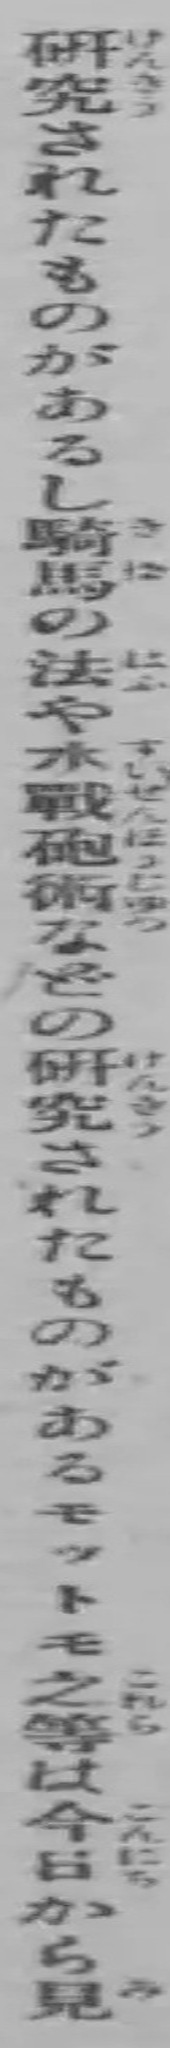研究されたものがあるし騎馬の法や水戦砲術などの研究されたものがあるモツトモ之等は今日から見
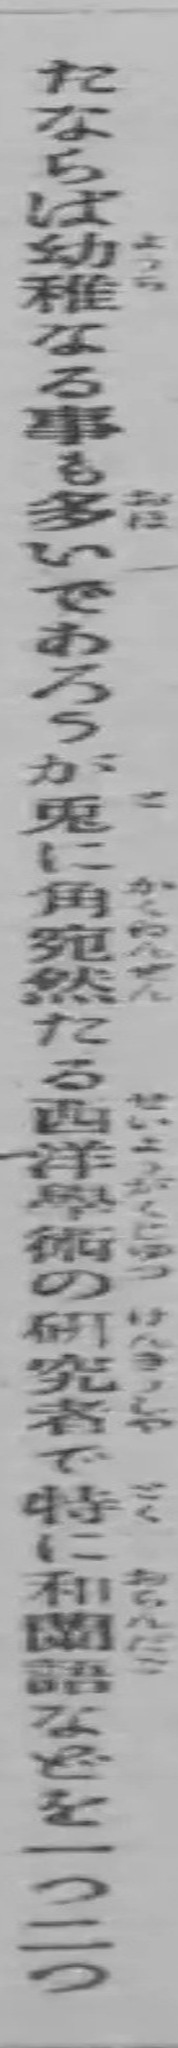たならば幼稚なる事も多いであろうが兎に角宛然たる西洋学術の研究者で特に和蘭語などを一つ二つ
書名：豊橋市史談
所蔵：国立国会図書館 National Diet Library, JAPAN
